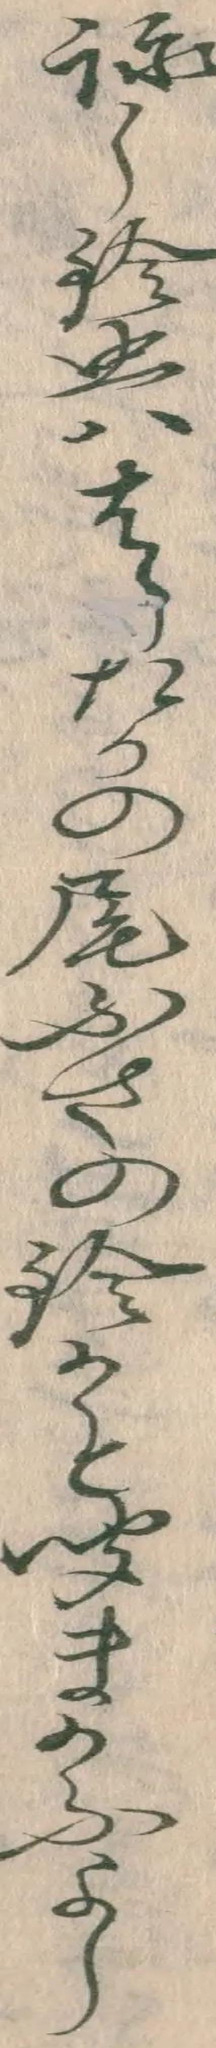詠し鈴虫ははしたかの尾ふさの鈴かと聞まかふよし
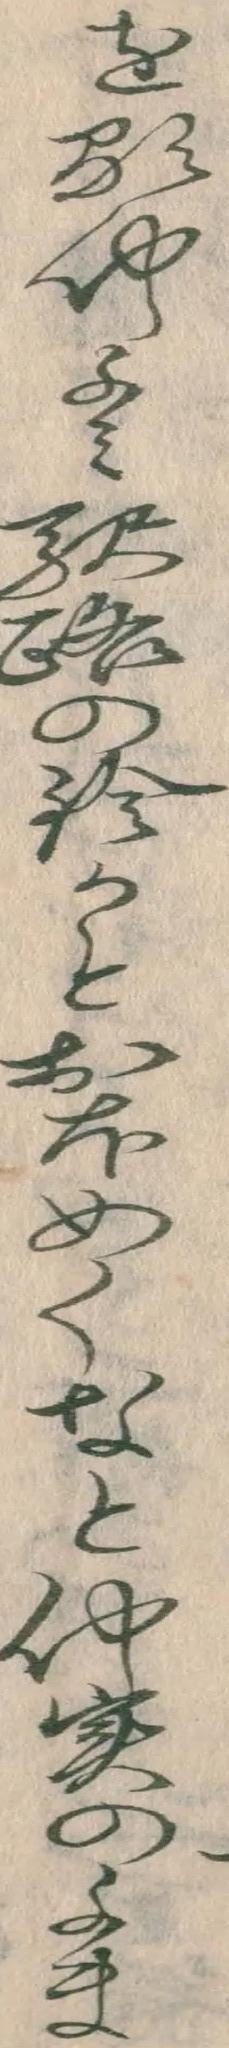を顕仲よみ駅路の鈴かとおほめくなと仲実のよま
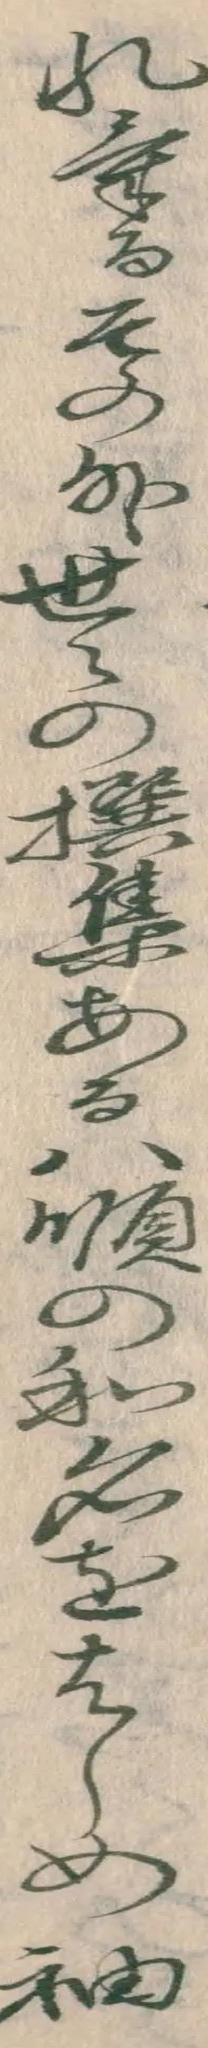れ奉るその外世々の撰集あるは順の和名をはしめ袖
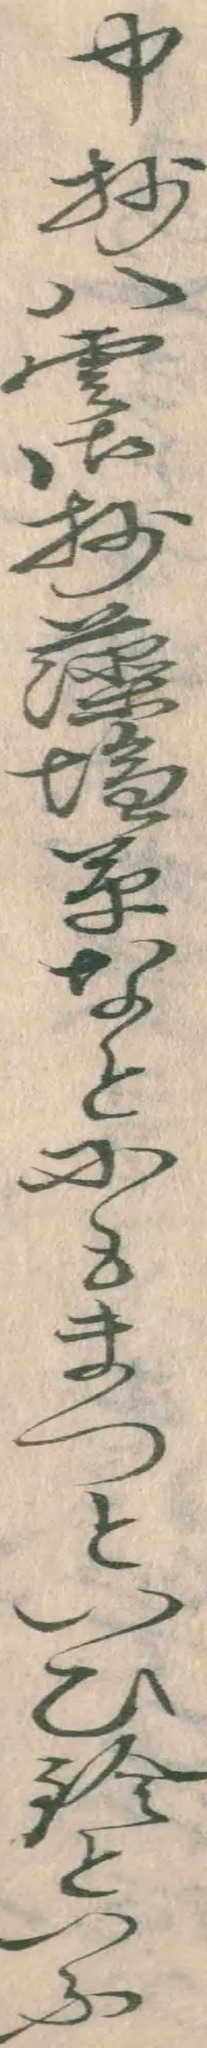中抄八雲御抄藻塩草なとにもまつといひ鈴といふ
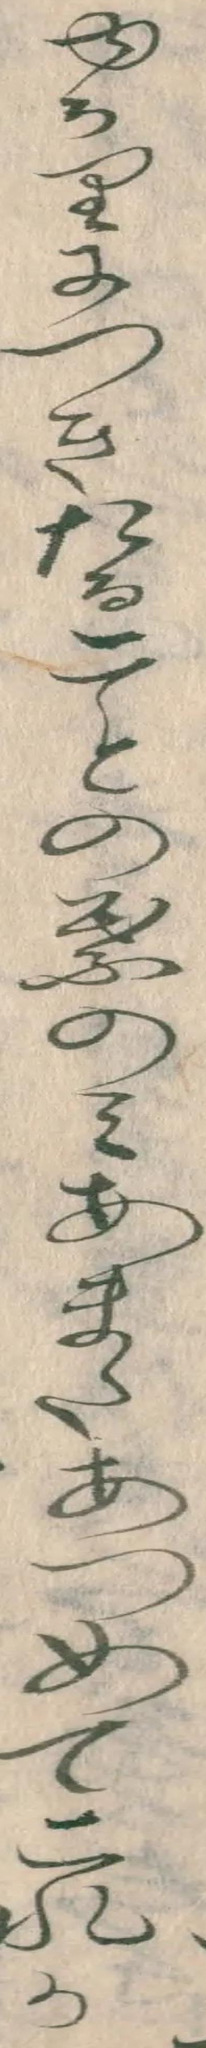ゆかりにつきたることの葉のみあまたあつめてこれか
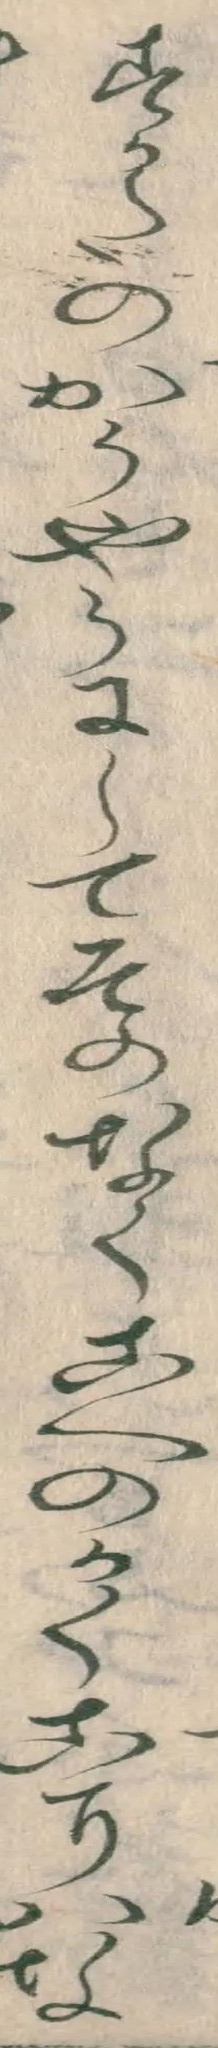すかたのかうやうにしてそのなくこへのかくこそはな
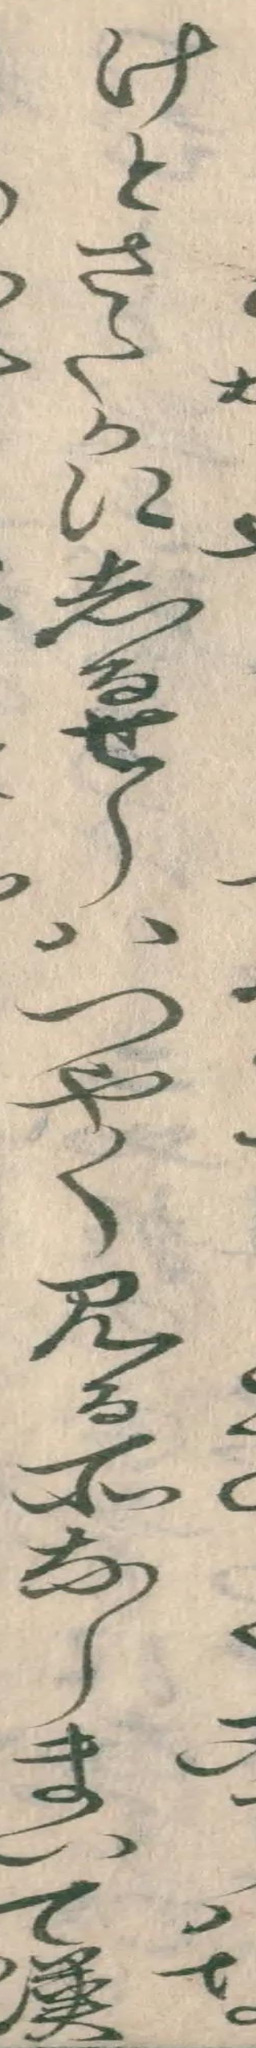けとさたかにしるせしはつや〱見る所なしまいて漢
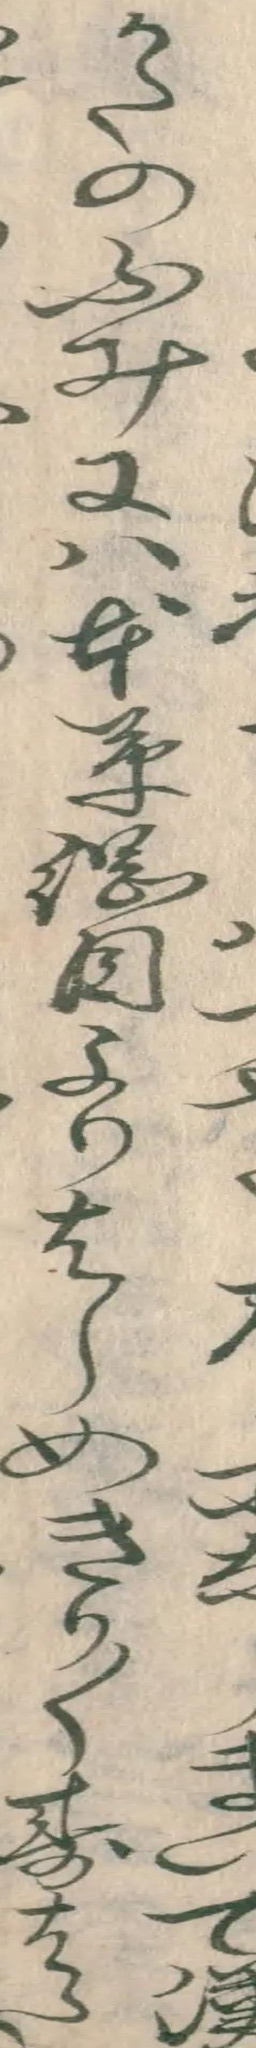かたのふみには本草綱目よりはしめきり〱すはた
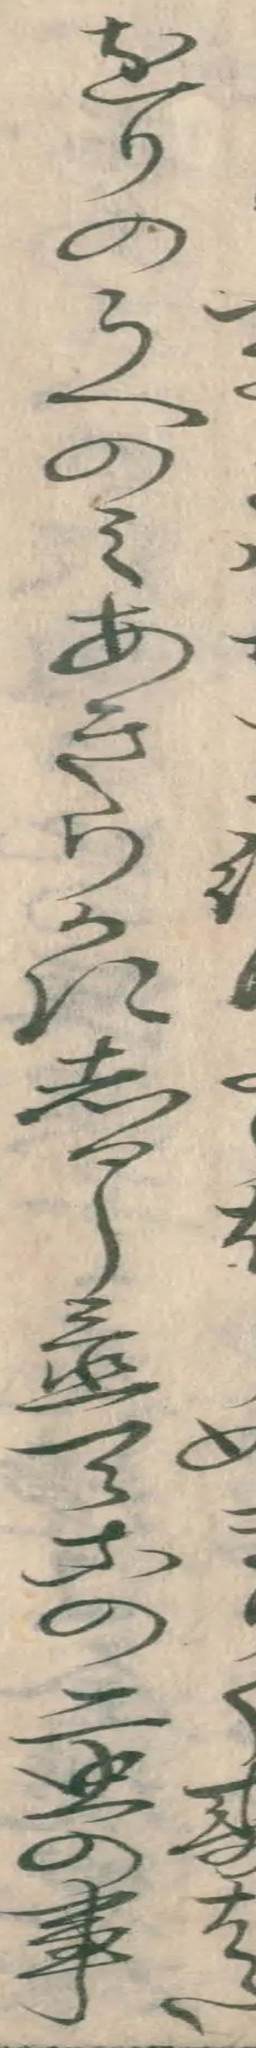をりのこへのみあきらかにしるし置てこの二虫の事

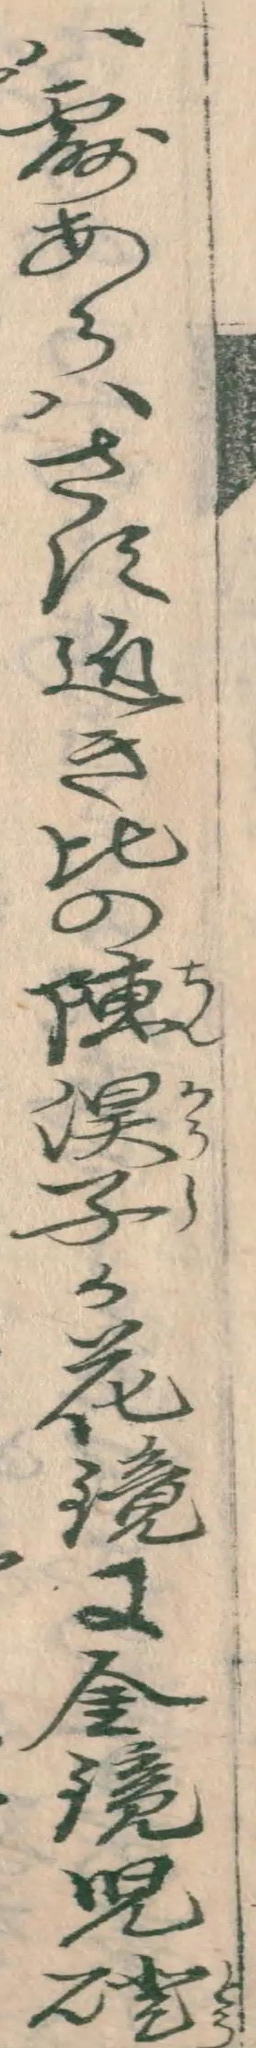は露あらはさす近き比の陳淏子か花鏡に金鐘児磴
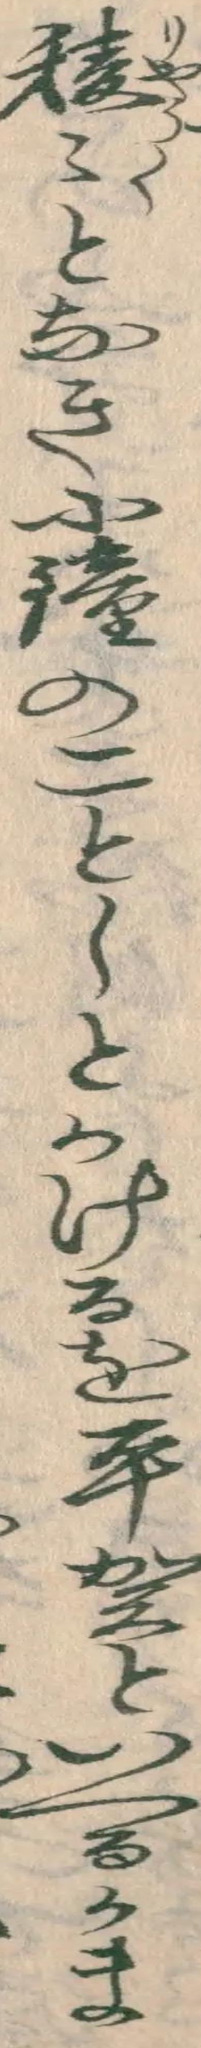稜々となき小鐘のことしとかけるを平賀といへるかま
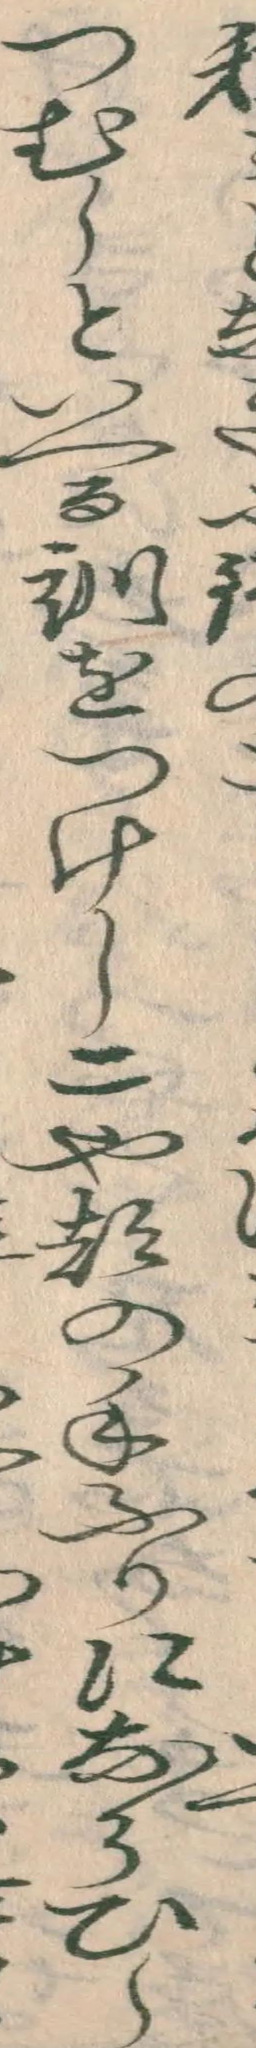つむしといへる訓をつけしこや都のてふりにならひし
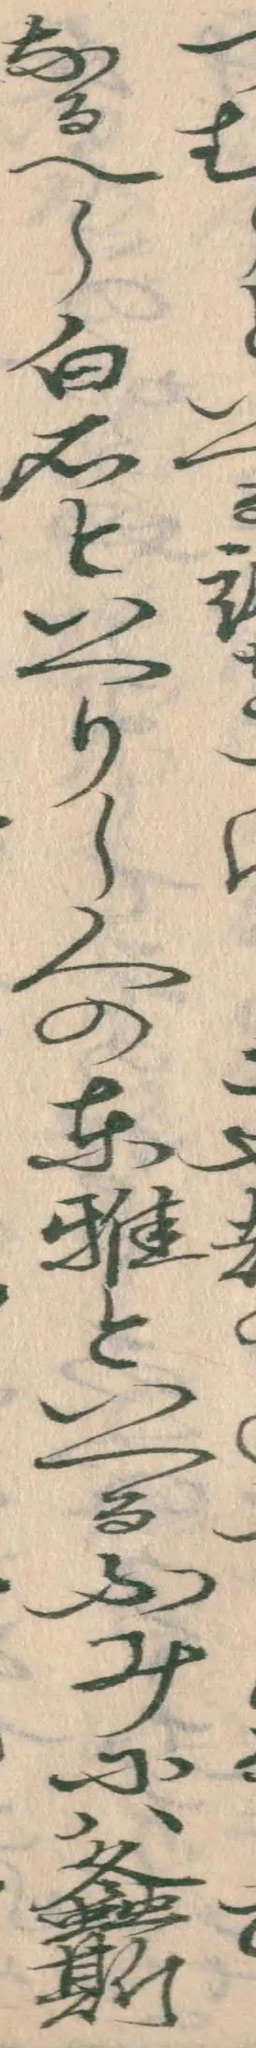なるへし白石といへりし人の東雅とへるふみには螽斯
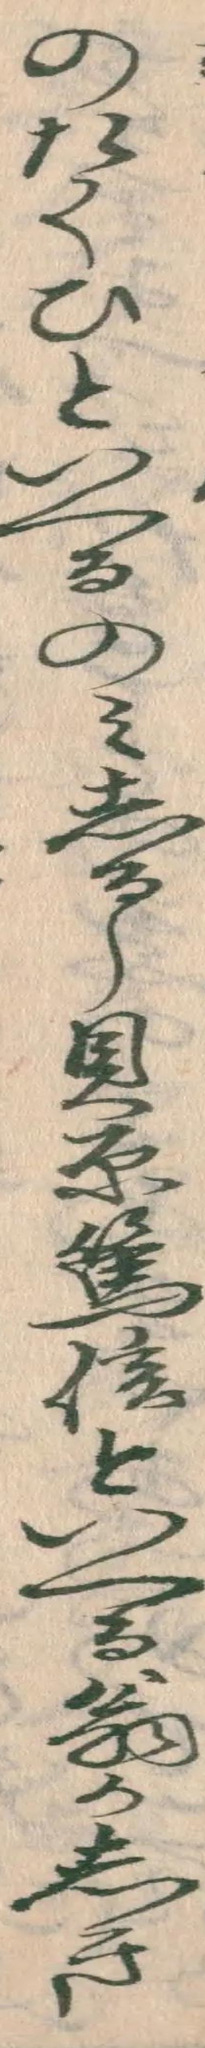のたくひといへるのみしるし貝原篤信といへる翁かしき
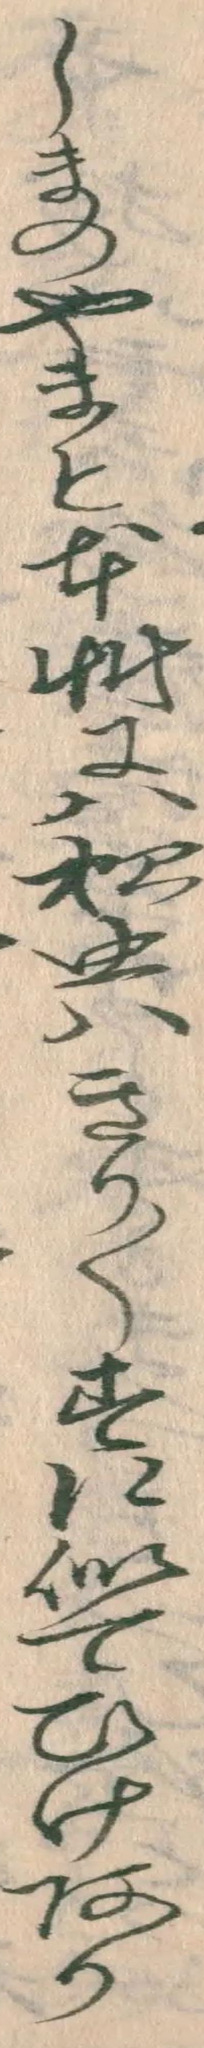しまのやまと本草には松虫はきり〱すに似てひけあり
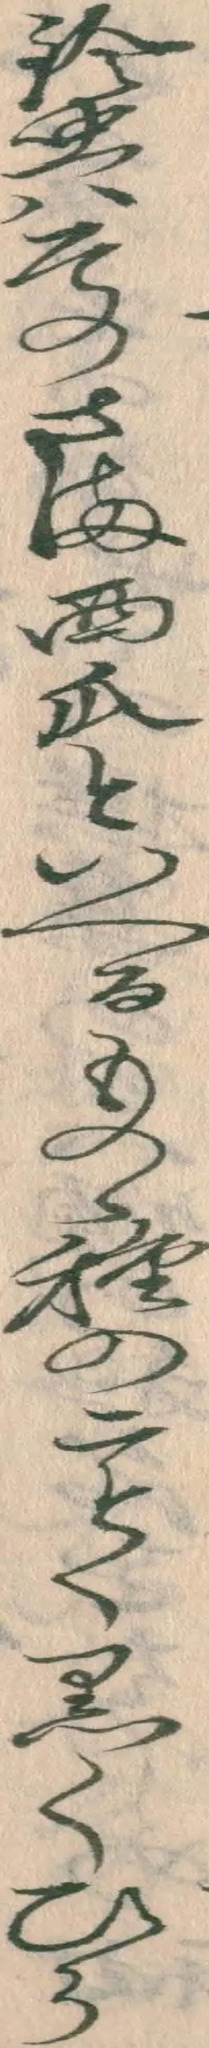鈴虫はそのさま西瓜とへるものゝ種のことく黒くひろ
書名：千蟲譜 3巻. [3]
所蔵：国立国会図書館 National Diet Library, JAPAN
